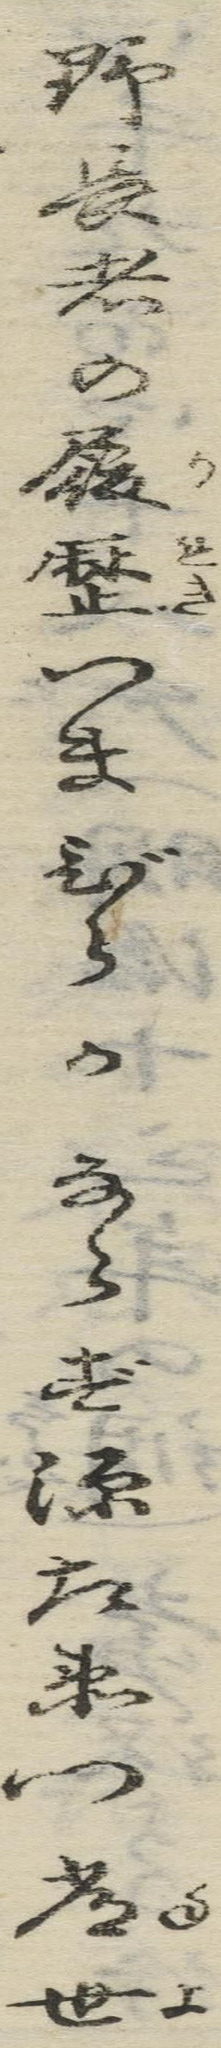野長者の履歴つまびらかならず源左衛門常世
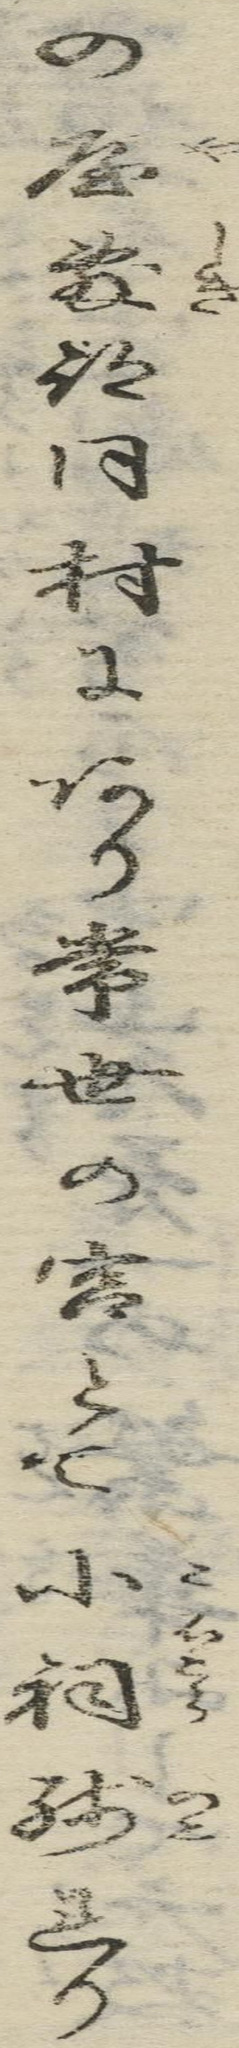の屋敷跡同村にあり常世の宮とて小祠残れり
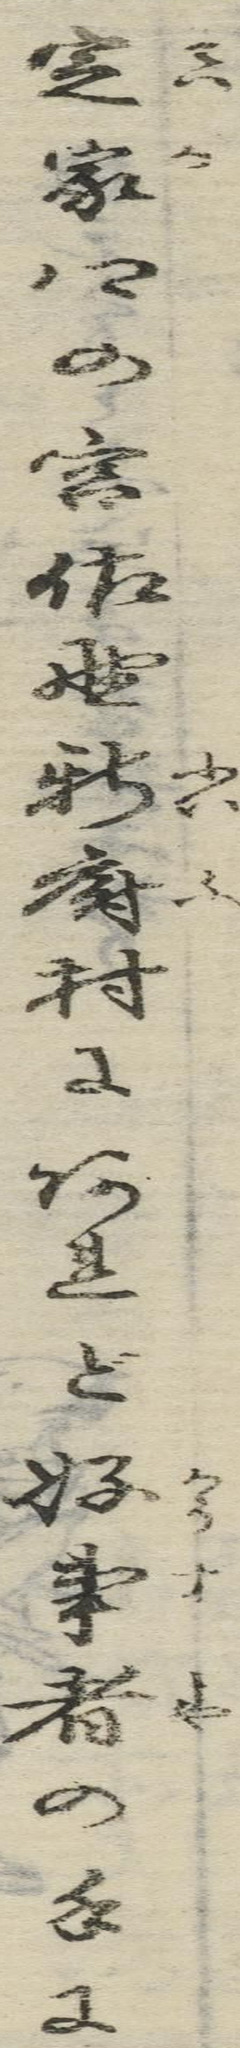定家卿の宮佐野新府村にあれど好事者の手に
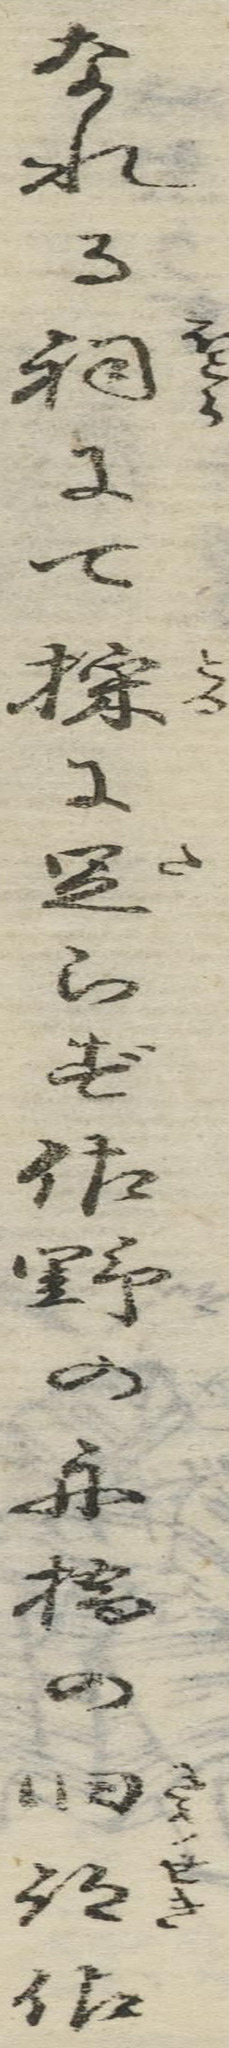なれる祠に採に足らず佐野の舟橋の旧跡佐
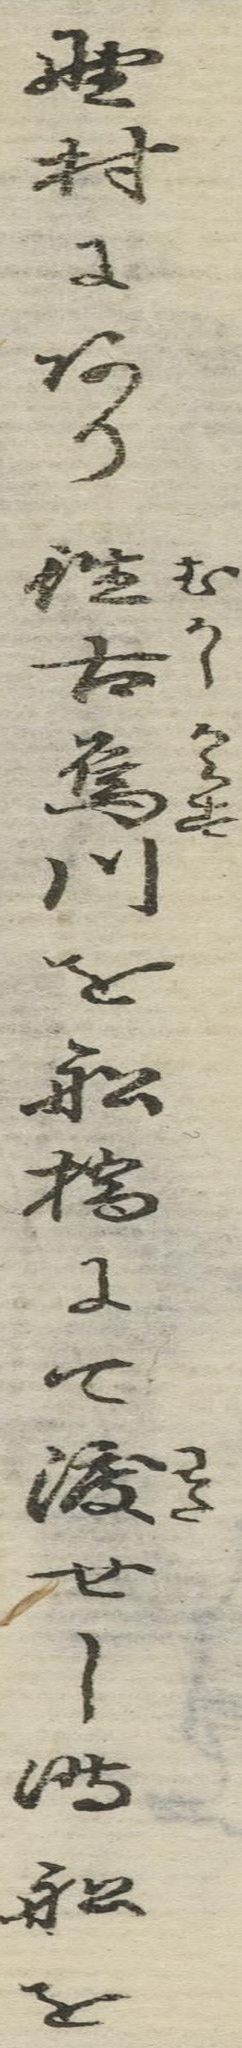野村にあり往古烏川を船橋にて渡せし時船を
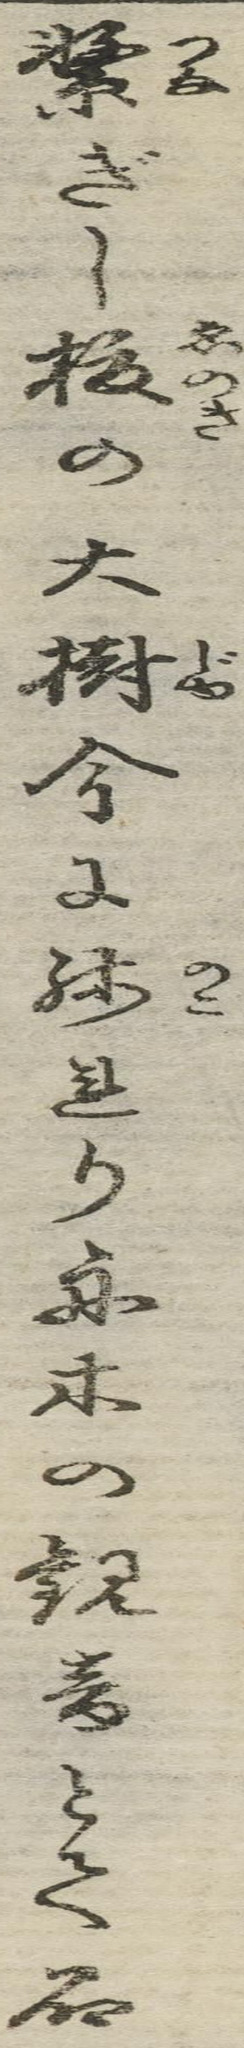繋ぎし榎の大樹今に残れり舟木の観音とて名
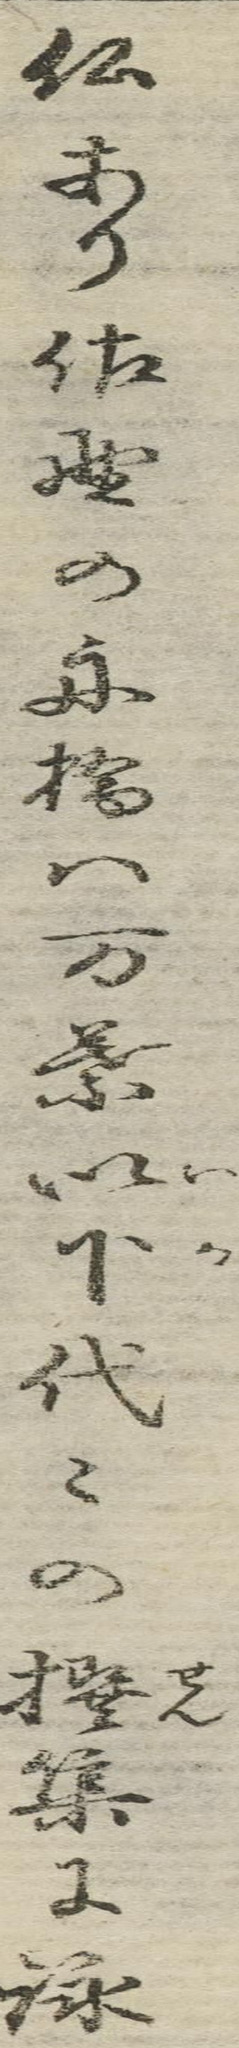仏あり佐野の船橋は万葉以下代々の撰集に詠
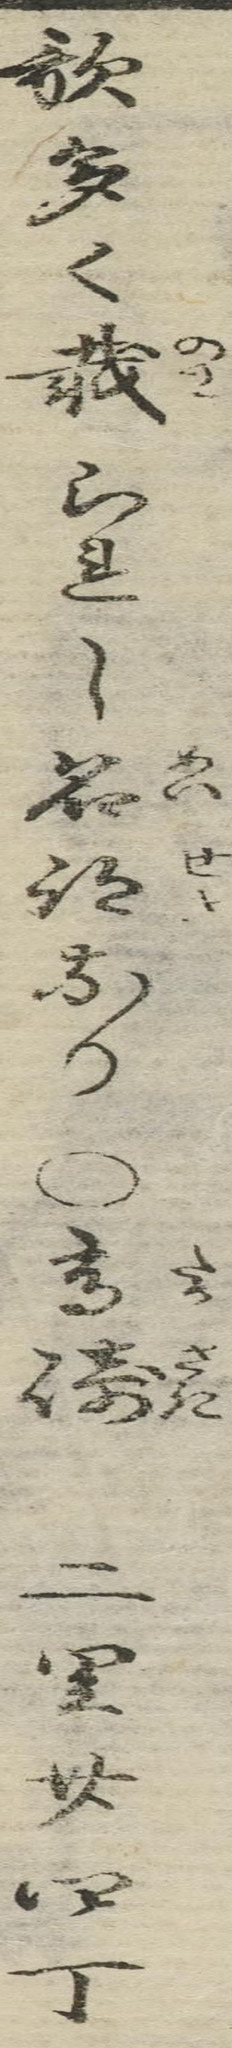歌多く載られし名跡なり○高崎二里廿四丁
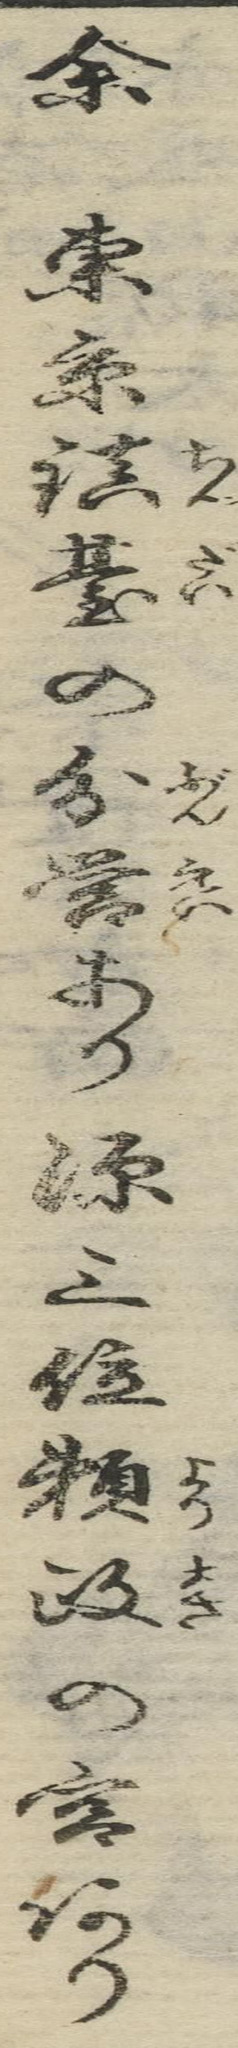余東京鎮臺の分営あり源三位頼政の宮あり

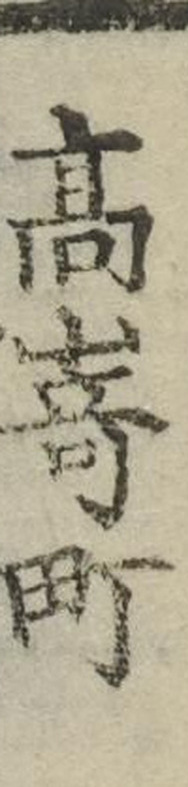高嵜町
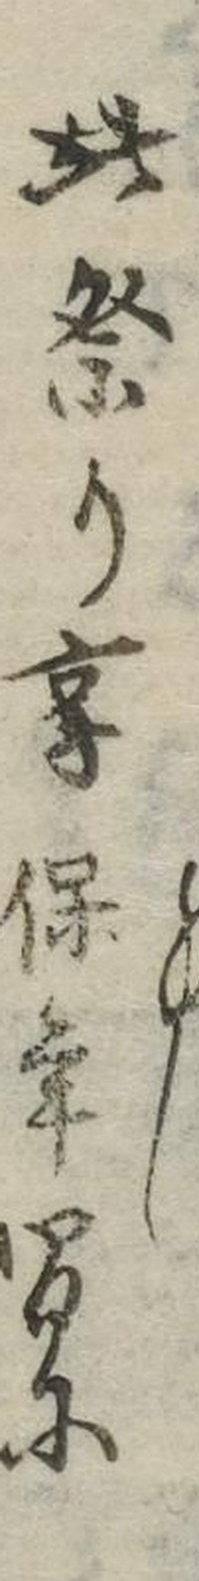此祭り享保年間に
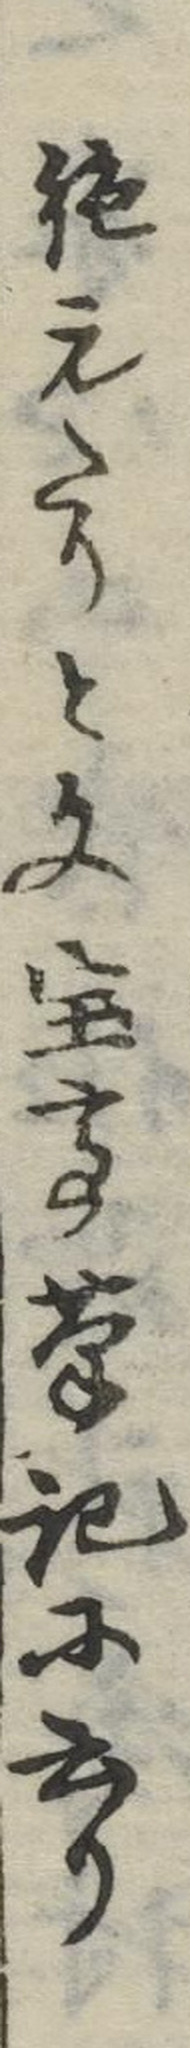絶えたりと文宝亭草記に云り
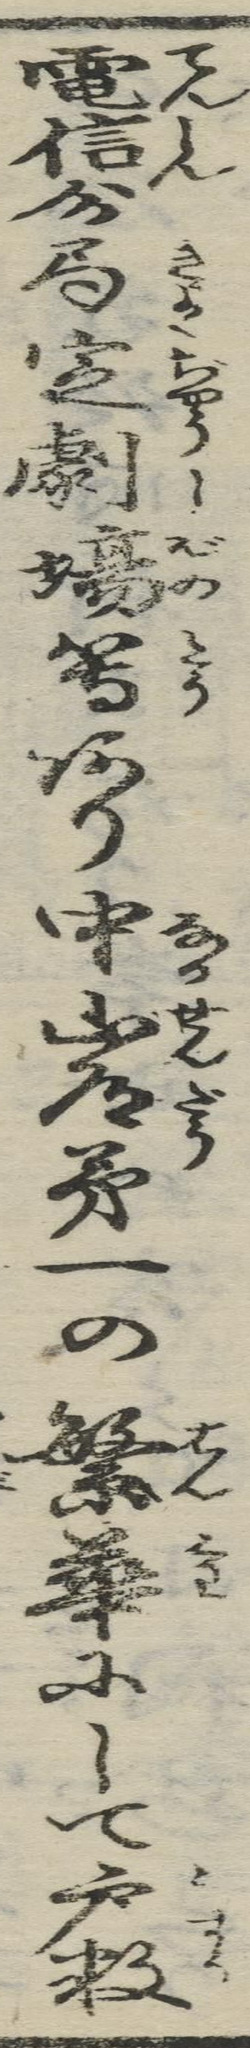電信分局定劇場等あり中山道第一の繁華にして戸数
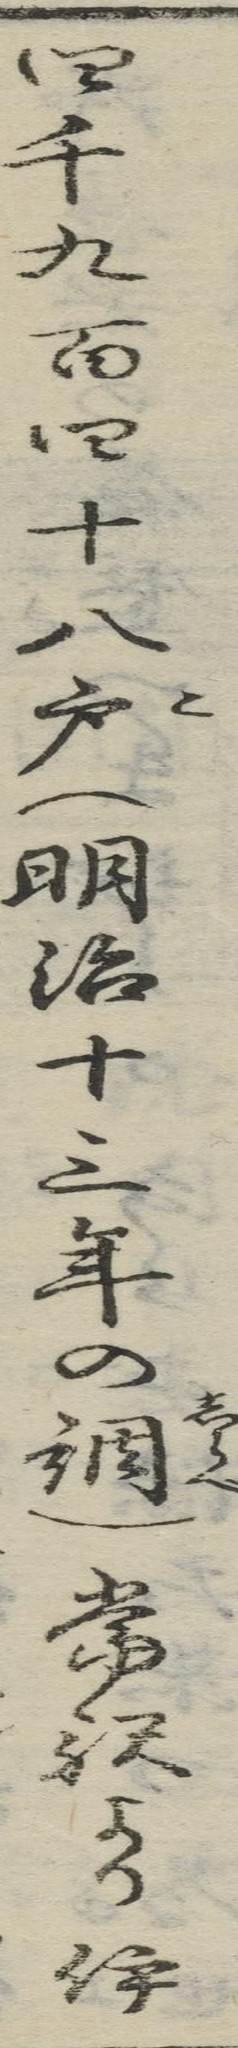四千九百四十八戸〔明治十三年の調〕当駅より伊
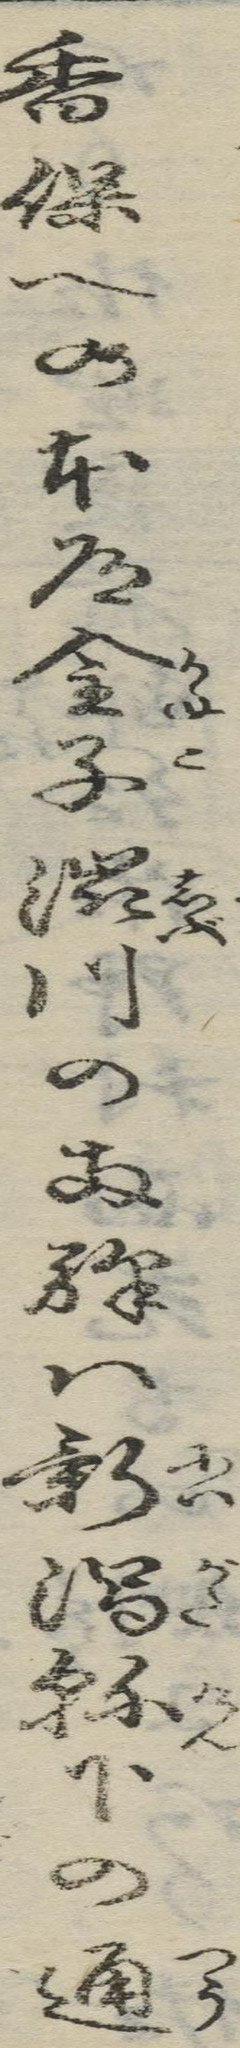香保への本道金子渋川の両駅は新潟県下の通
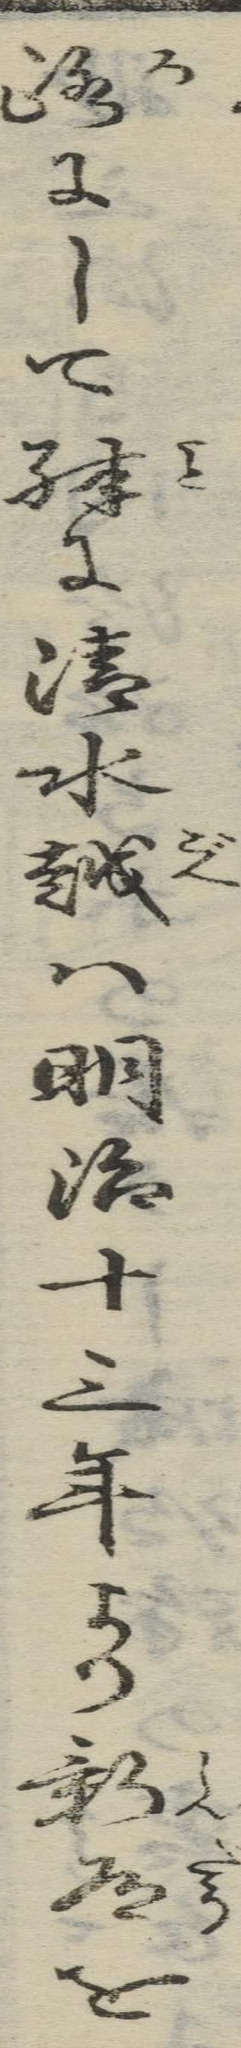路にして殊に清水越は明治十三年より新道を
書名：上州伊香保鑛泉圖會　全
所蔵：東京大学地震研究所図書室 Earthquake Research Institute Library, The University of Tokyo, JAPAN
